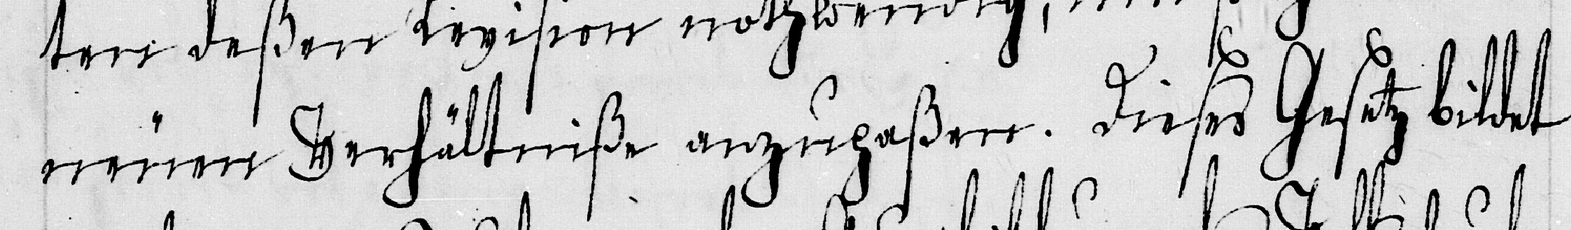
neuen Verhältniße anzupaßen. Dieses Gesetz bil¬
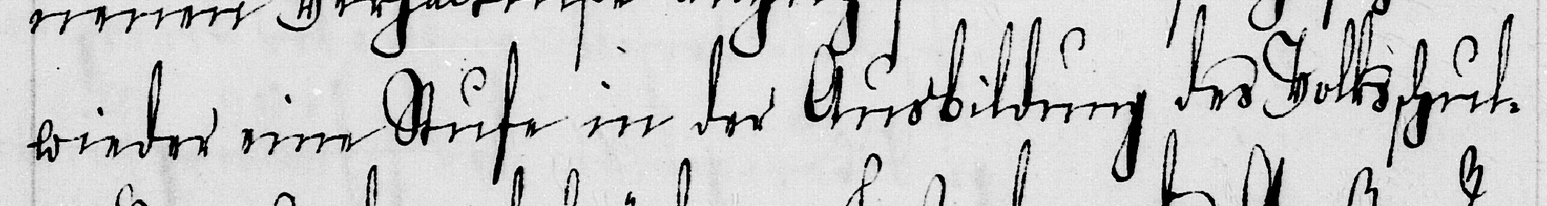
wieder eine Stufe in der Ausbildung des Volksschul¬
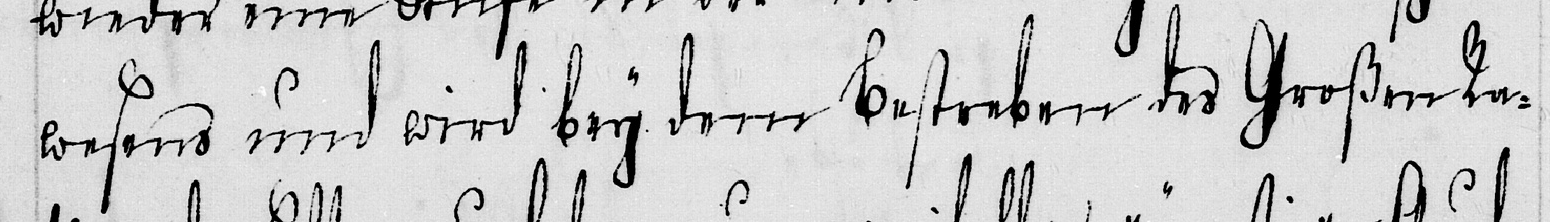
wesens und wird bey dem Bestreben des Großen Ra¬
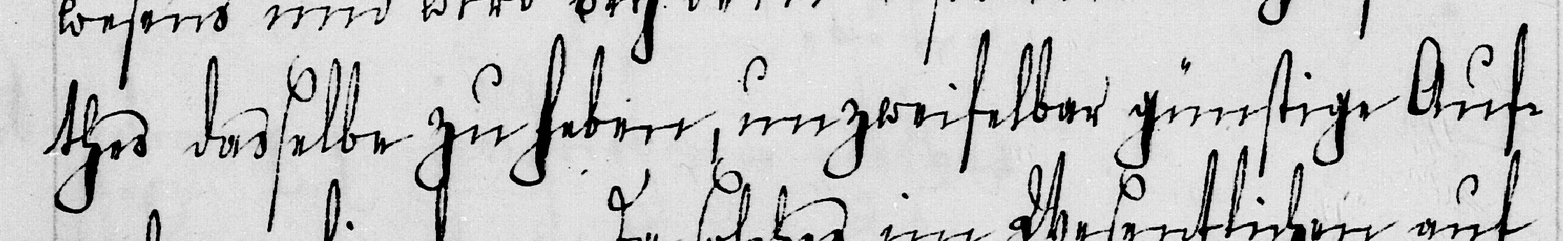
thes dasselbe zu haben, unzweifelbar günstige Auf¬
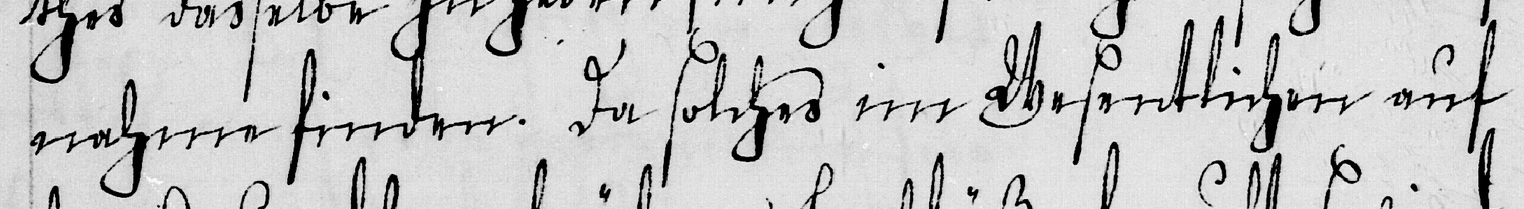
nahme finden. Da solches im Wesentlichen auf
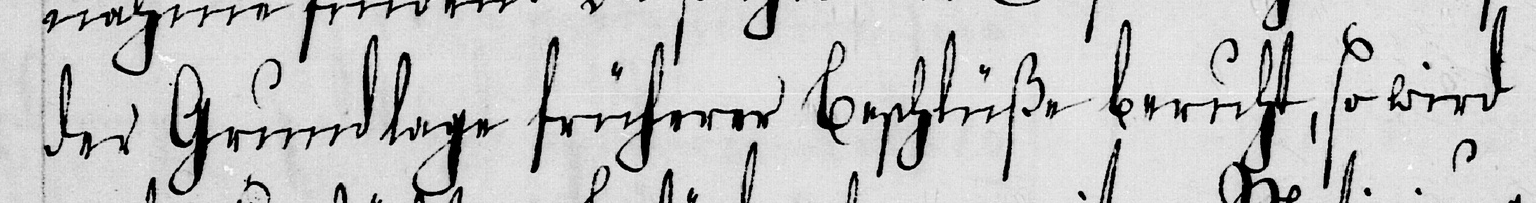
der Grundlage früherer Beschlüße beruht, so wird
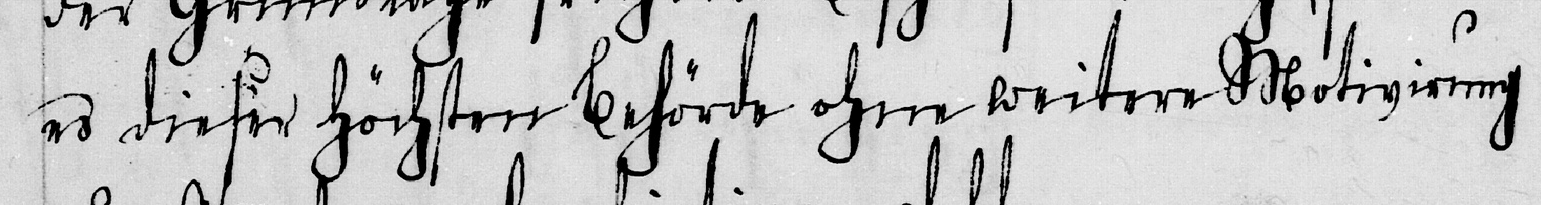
es dieser Höchsten Behörde ohne weitere Motivirung
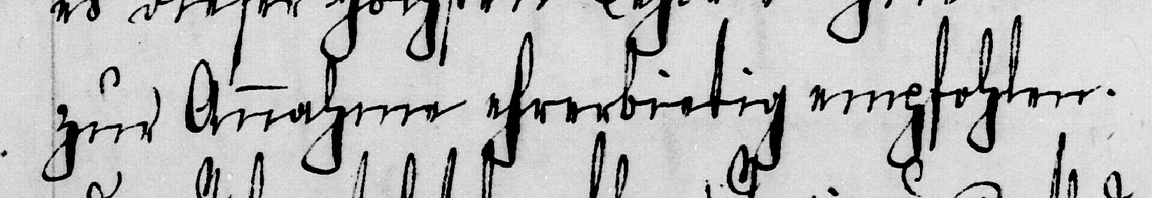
zur Annahme ehrerbietig empfehlen.
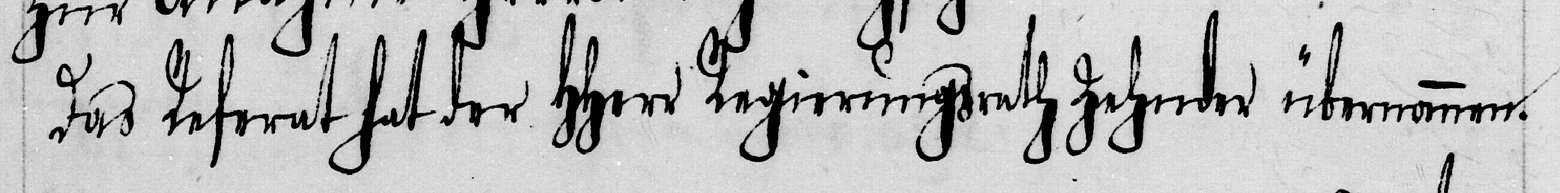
Das Referat hat der HHerr Regierungsrath Zehnder übernommen.
